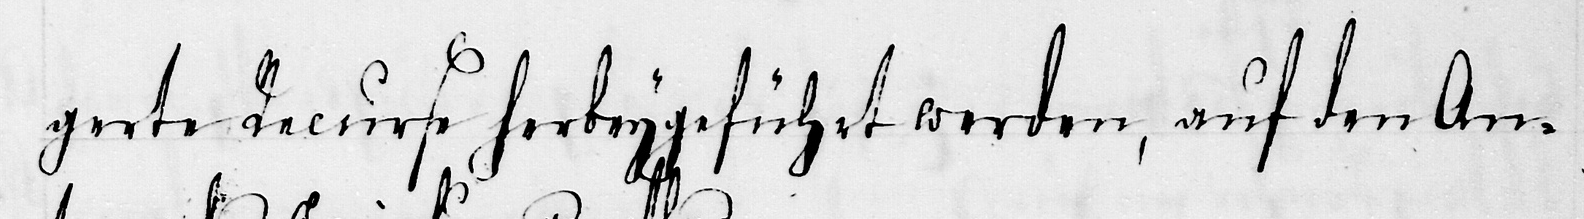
gerte Recurse herbeigeführt werden, auf den An¬
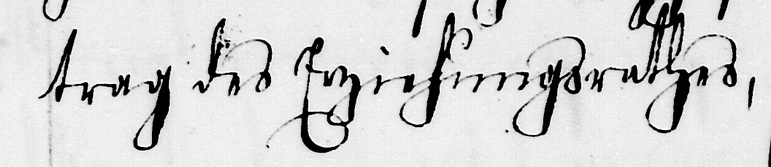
trag des Erziehungsrathes,
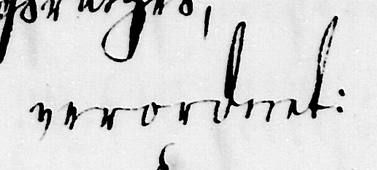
verordnet:
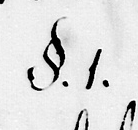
§. 1.
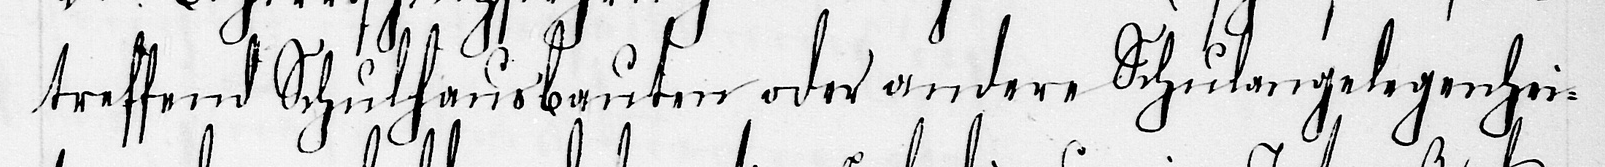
treffend Schulhausbauten oder andere Schulangelegenhei¬
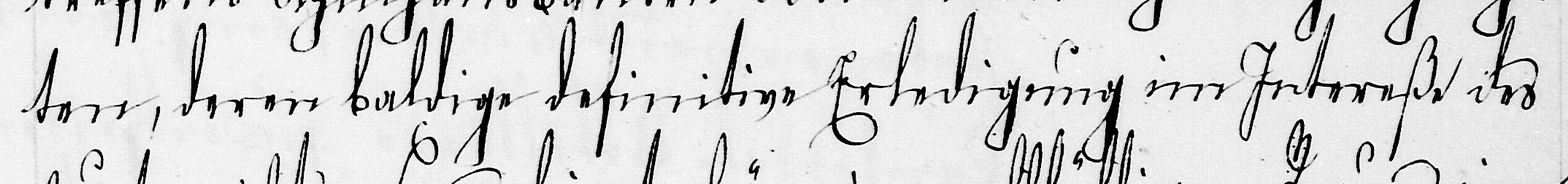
ten, deren baldige definitive Erledigung im Intereße des
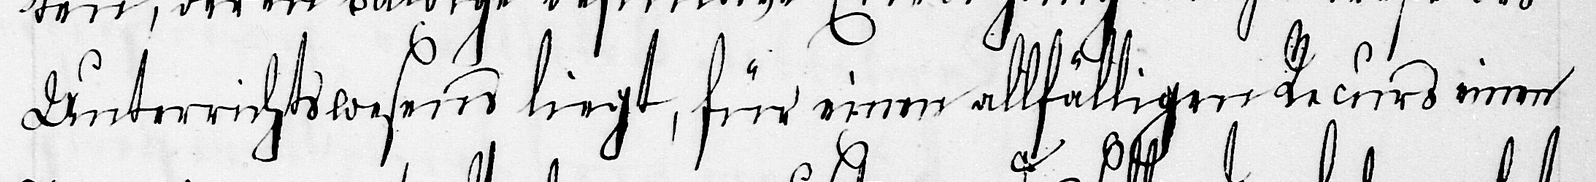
Unterrichtswesens liegt, für einen allfälligen Recurs einen
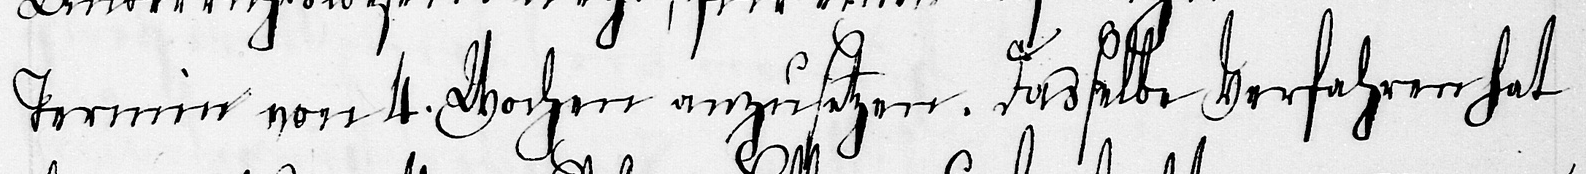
Termin von 4. Wochen anzusetzen. Dasselbe Verfahren hat
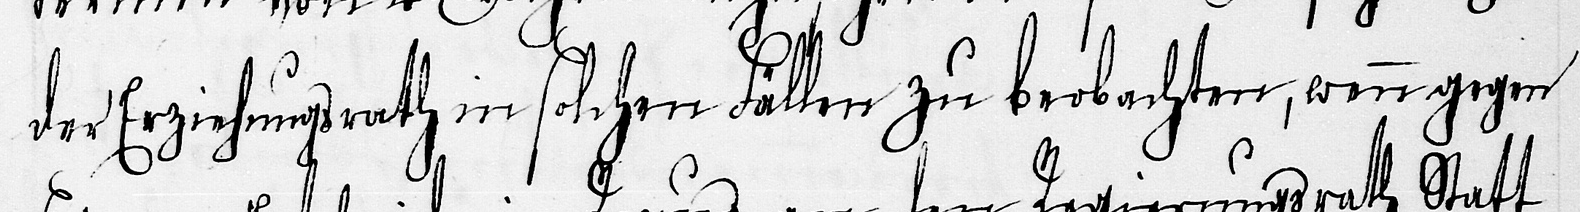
der Erziehungsrath in solchen Fällen zu beobachten, wenn gegen
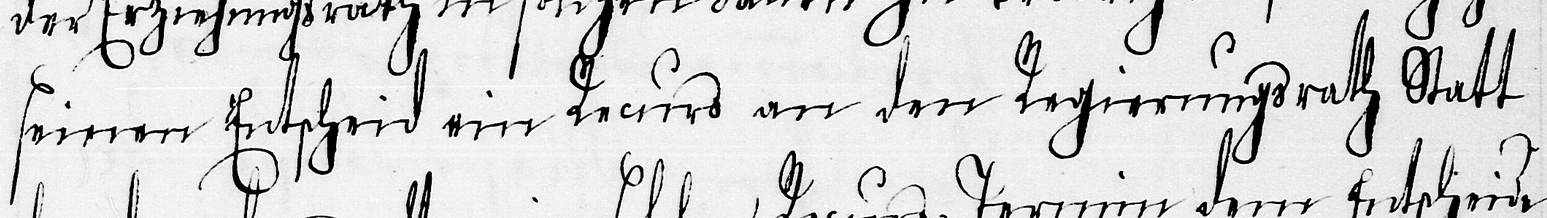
seinen Entscheid ein Recurs an den Regierungsrath Statt
